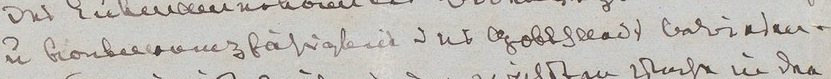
u Konkurrenzfähigkeit des Gotthards bewiesen.
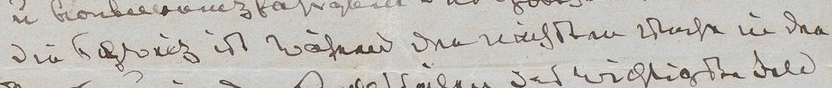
Die Schweiz ist während der nächsten Woche in der
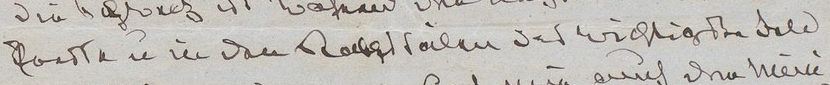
Presse u in den Rathssälen das wichtigste Feld
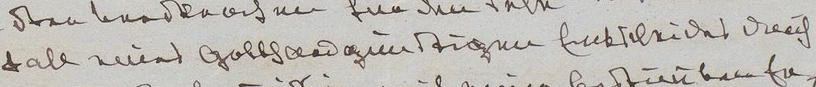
Fall eines Gotthard günstigen Entscheides durch
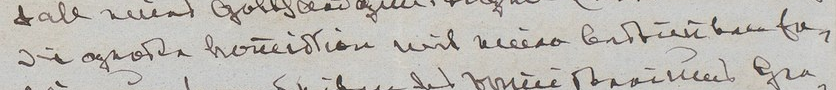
die große Kommission mit einer bestimmten Er-
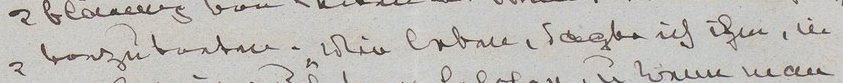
vorzutreten. Wir leben, sagte ich ihm, in
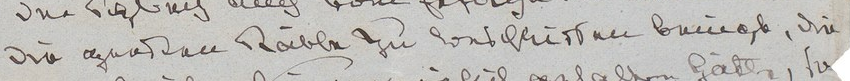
die grossen Räthe zu Beschlüssen bringt, die
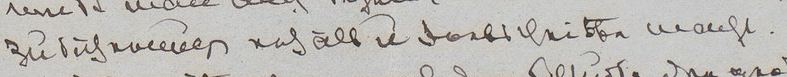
Zusicherungen erhält u Fortschritte macht.
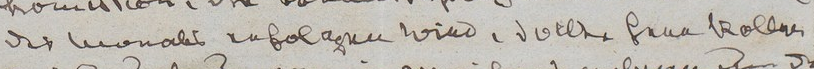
des Monats erfolgen wird, sollte Herr Koller
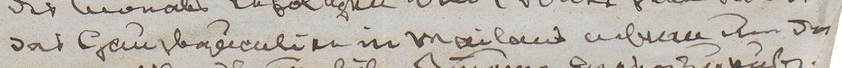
das Hauptexecutive in Mailand nehmen um die
